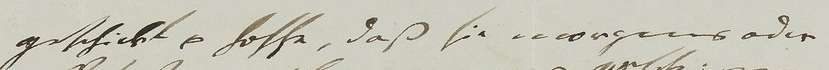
geschickt & hoffe, daß sie morgens oder
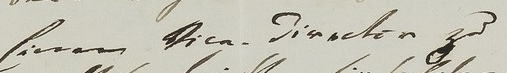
Einen Vice-Director zu
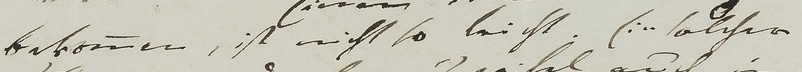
bekommen, ist nicht so leicht. Ein solcher
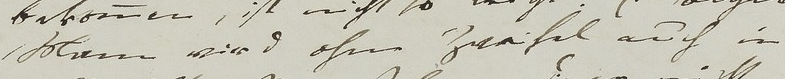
Mann wird ohne Zweifel auch in
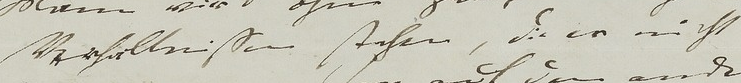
Verhältnissen stehen, die er nicht
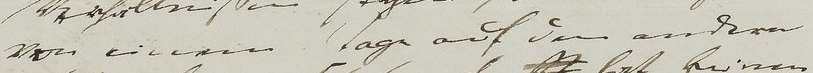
von einem Tage auf den andern
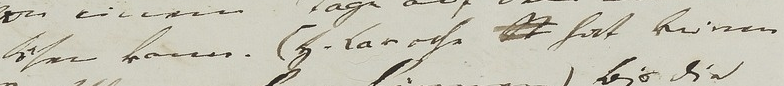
lösen kann. (H. Laroche hat keinen
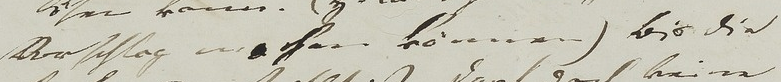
Vorschlag machen können) Bis die
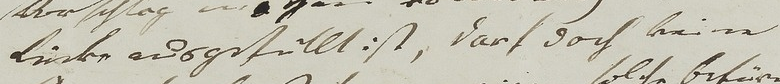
Lücke ausgefüllt ist, darf doch keine
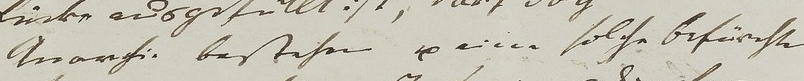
Anarchie bestehen & eine solche befürchte
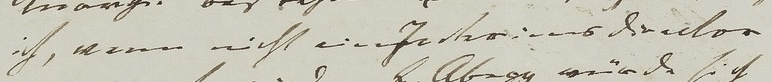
ich, wenn nicht ein Interimsdirector
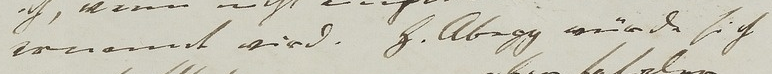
ernannt wird. H. Abegg würde sich
